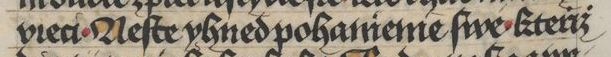vieci.Neſte yhned pohanieníe ſwe.kteṙiż
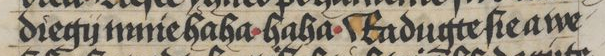diegij mnie haha.haha.Radugte ſie a we¬
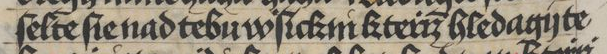ſelce ſie nad tebu wẛickni kteṙíż hledagijte¬
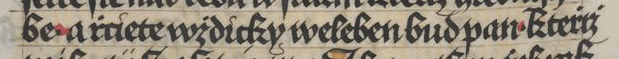be.a ṙciete wżdicky weleben bud pan.kteṙiż
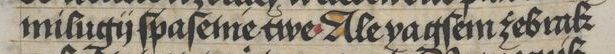mílugij ſpaſeníe twe.Ale yagſem żebrak
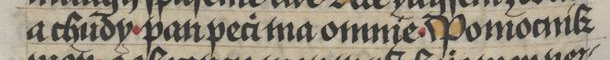a chudy.pan peċi ma omnie.Pomocník
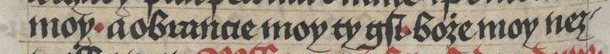moy.a obrancie moy ty gſi.boże moy nez¬
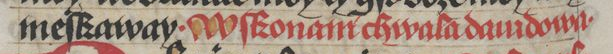meẛkaway.Wſkonaní chwala dauidowa.
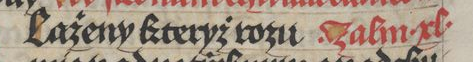Laženy kteryž rozu. Zalm.xl.
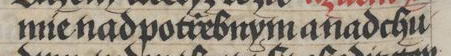míe.nadpotṙebnym a nadchu¬
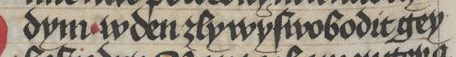dym.wden zlywyſwobodit gey
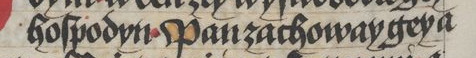hoſpodyn.Pan zachoway gey a
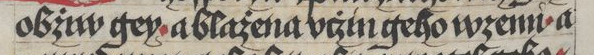obżiw gey.a blażena vcżin geho wzemi.a
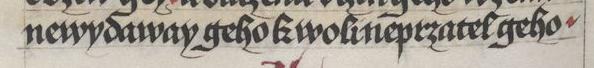newydaway geho k woli neprzatel geho.
